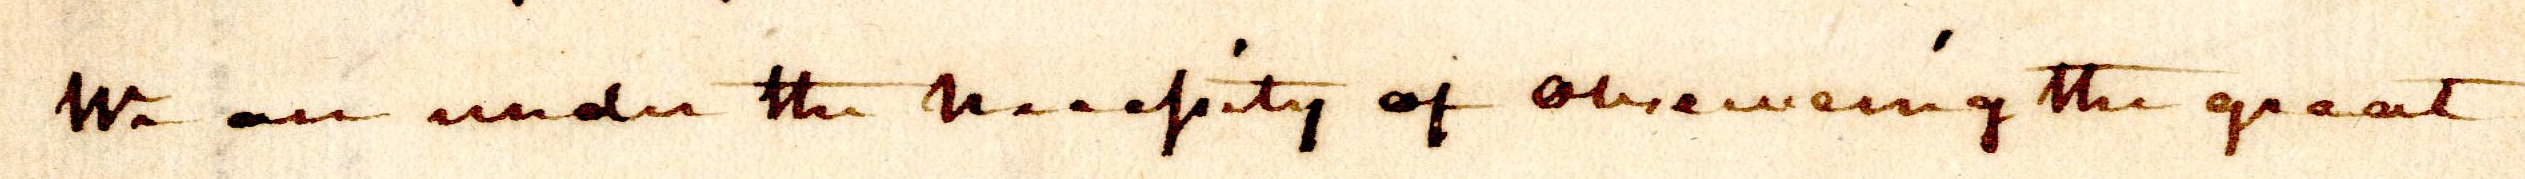We are under the Necessity of observing the great
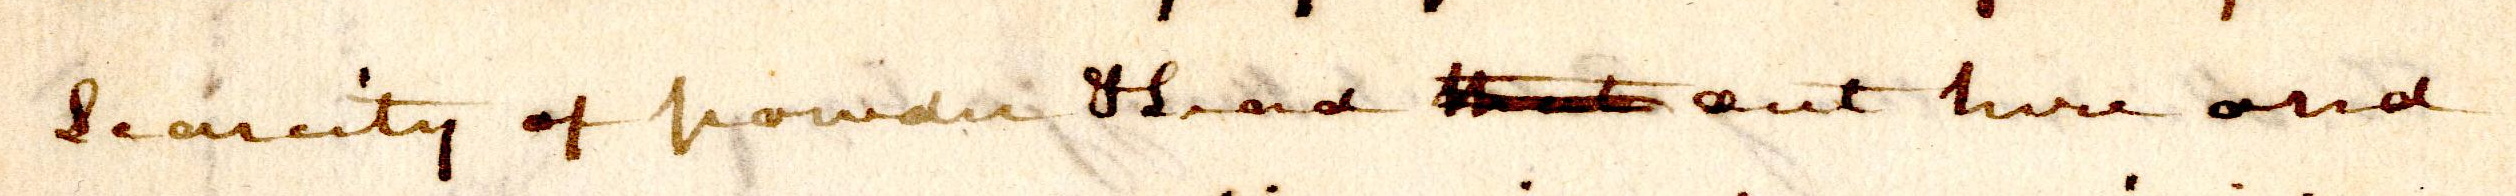Scarcity of powder & Lead [that] out here and
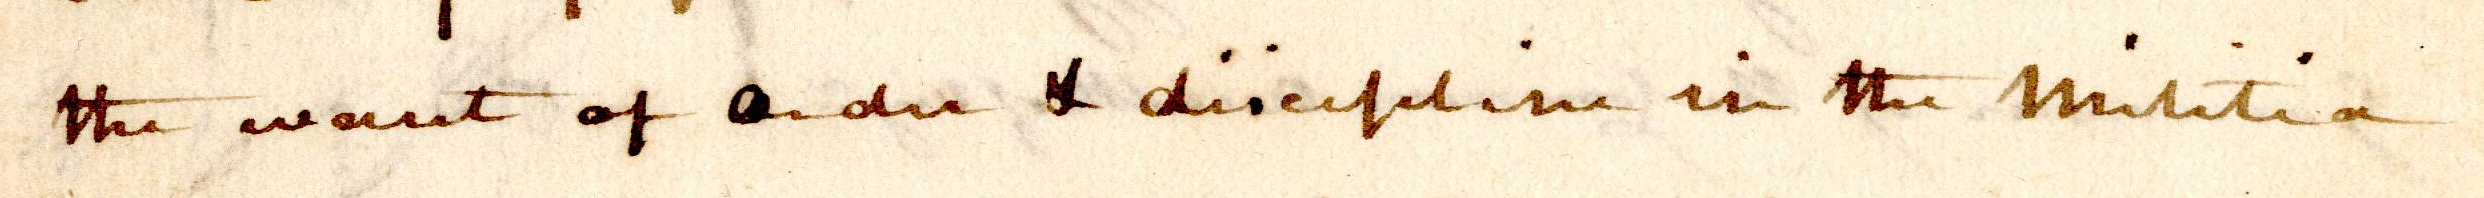the want of Order & discipline in the Militia
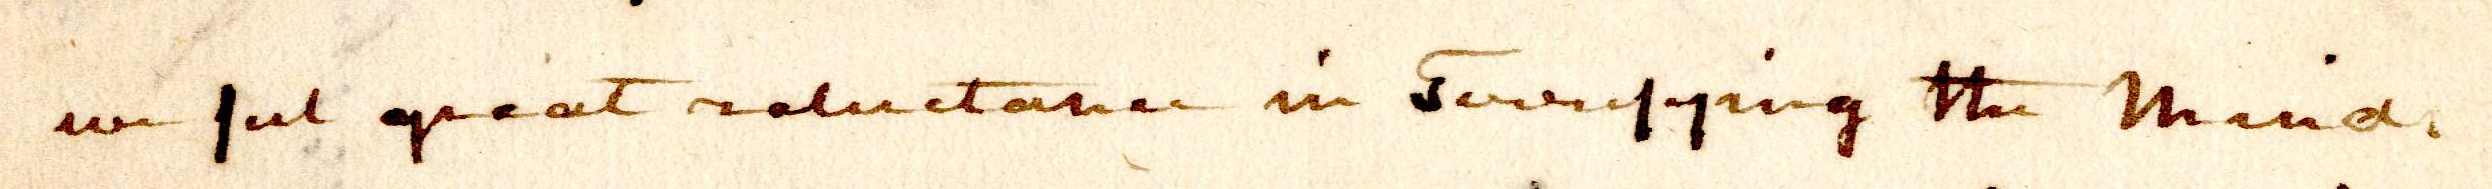we feel great reluctance in Terrifying the Mind.
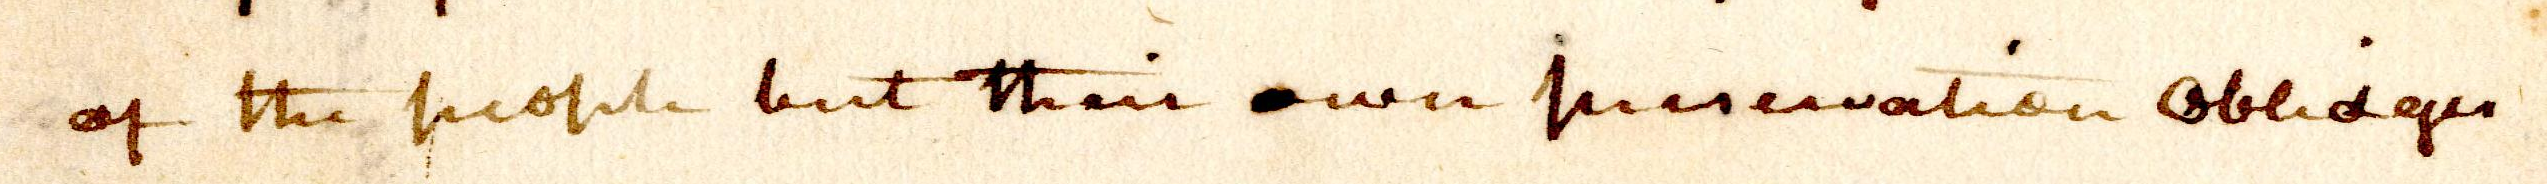of the people but their own preservation oblidges
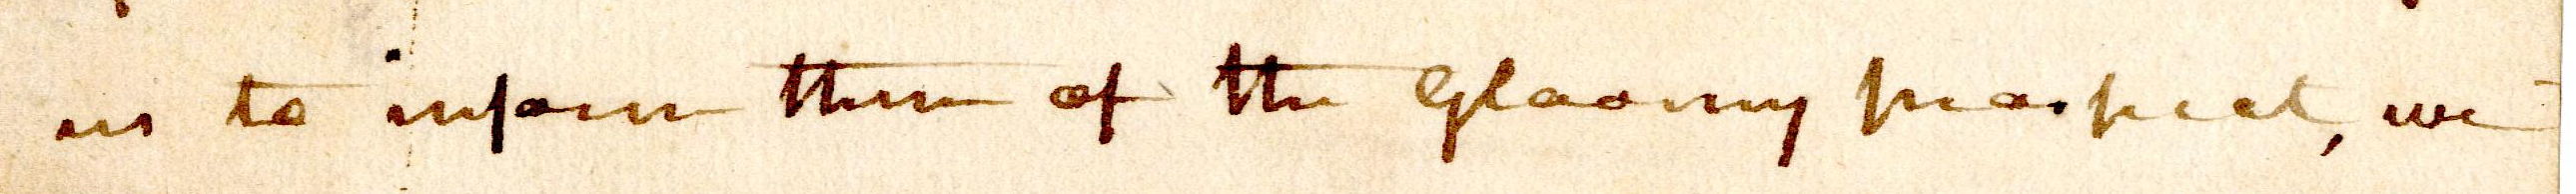us to inform them of the Gloomy prospect, we
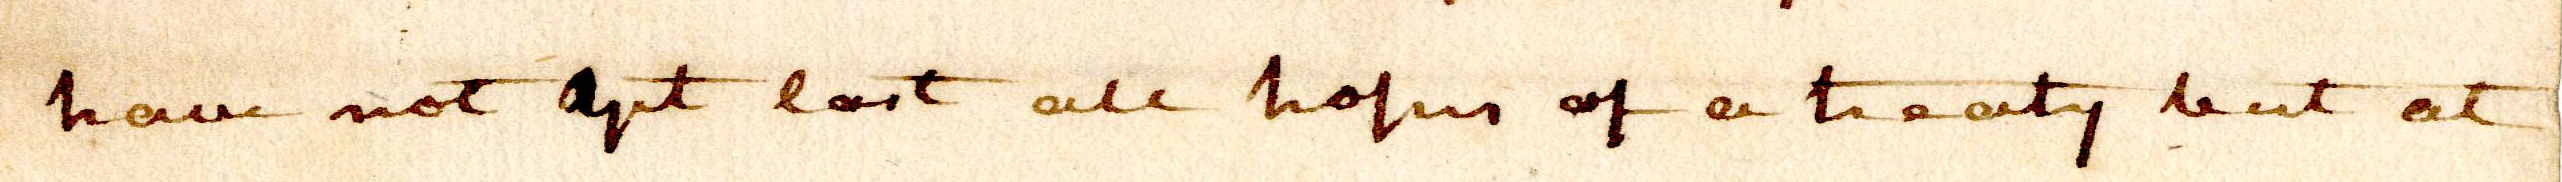have not yet lost all hopes of a treaty but at
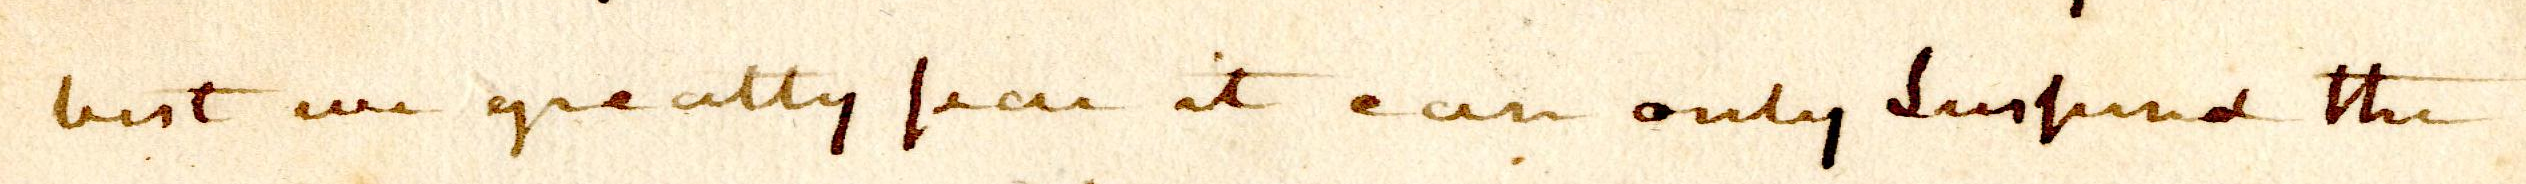best we greatly fear it can only Suspend the
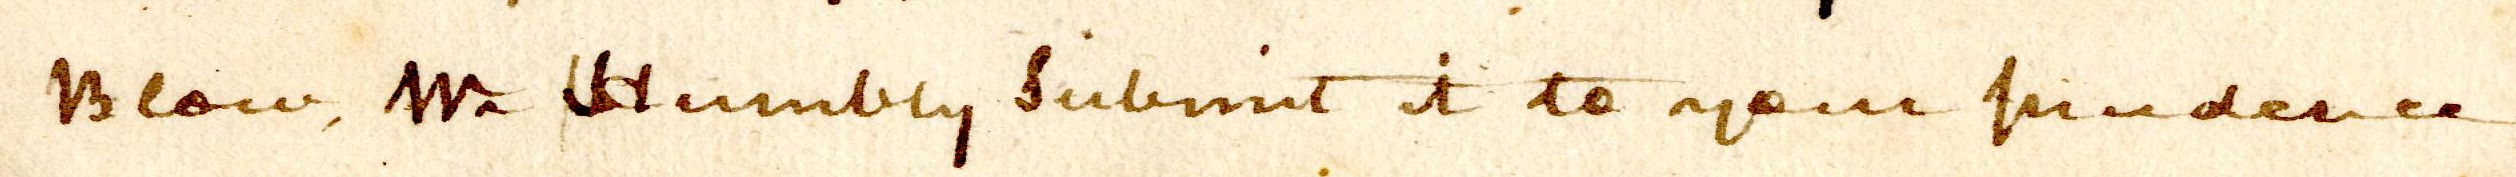Blow, We Humbly submit it to your prudence
